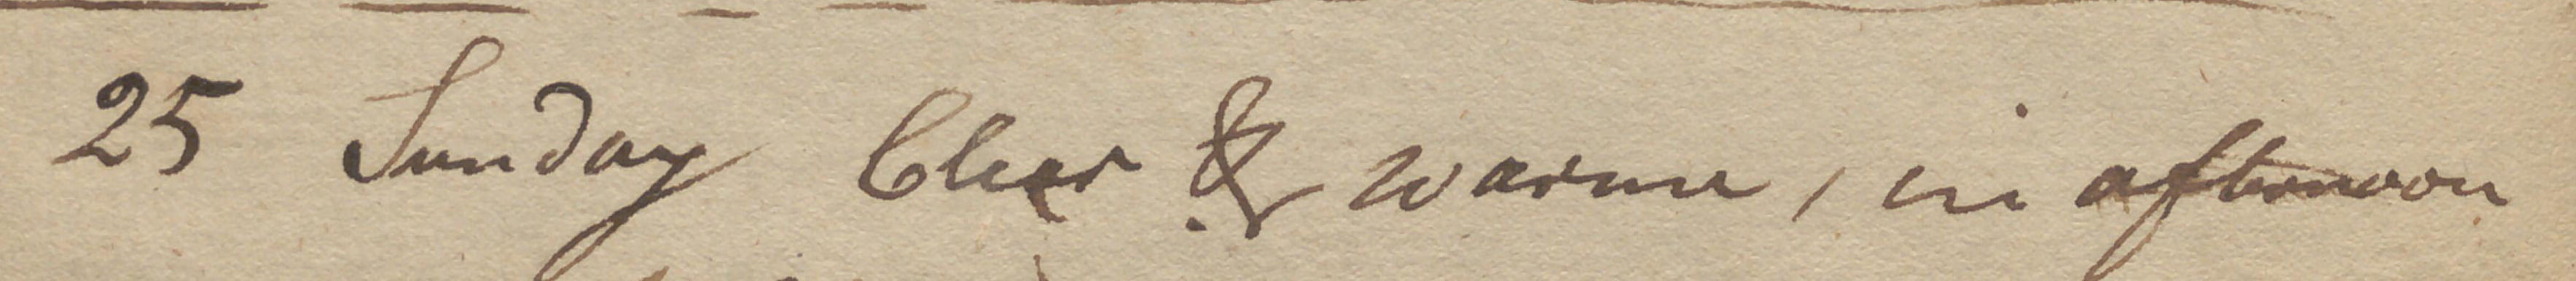25 Sunday Clear & warme, in afternoon
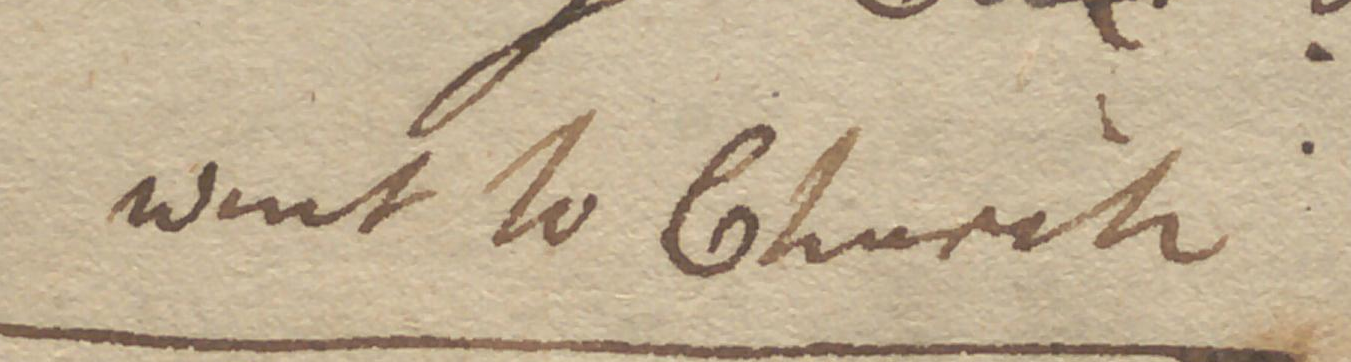went to Church
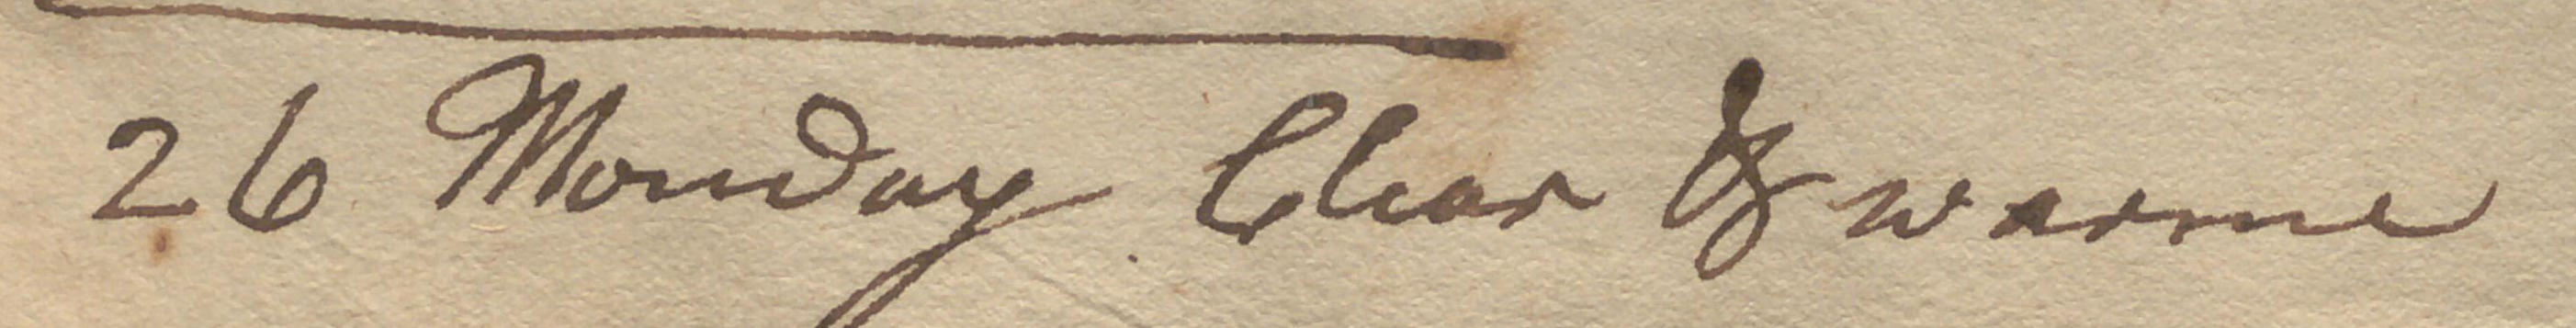26 Monday Clear & warme
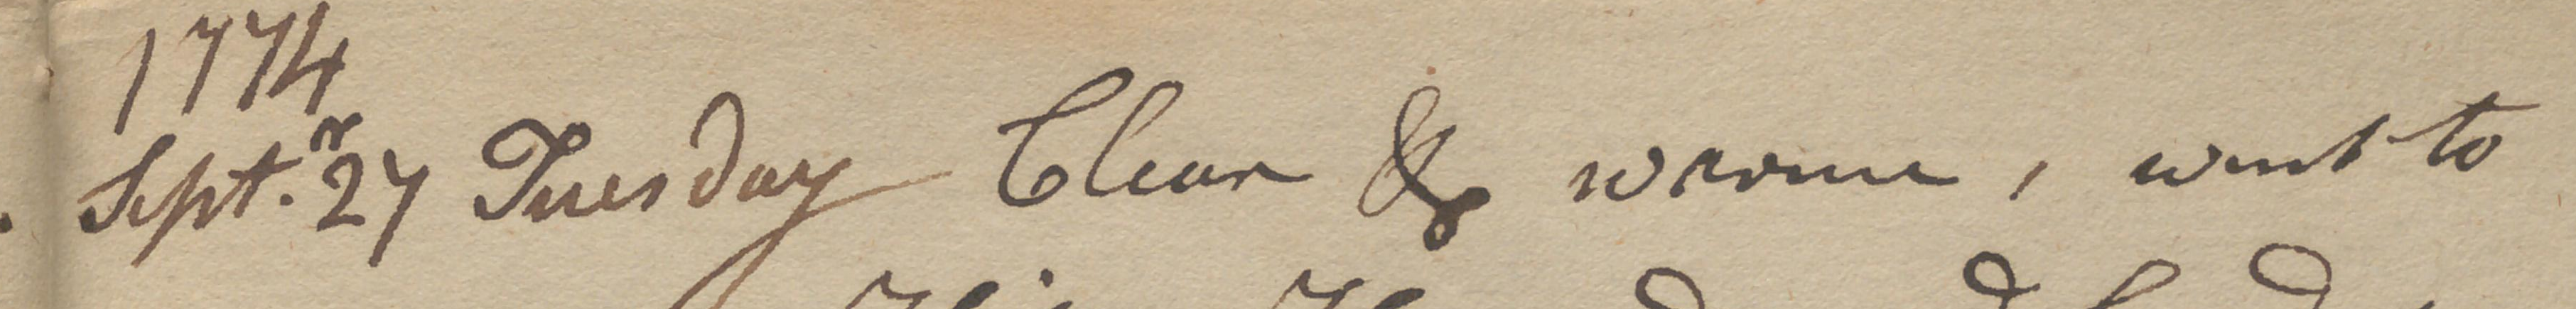Sept^r. 27 Tuesday Clear & warme, went to
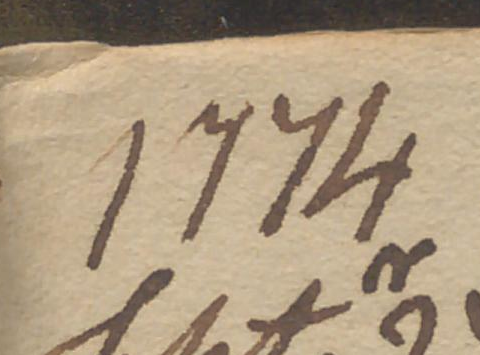1774
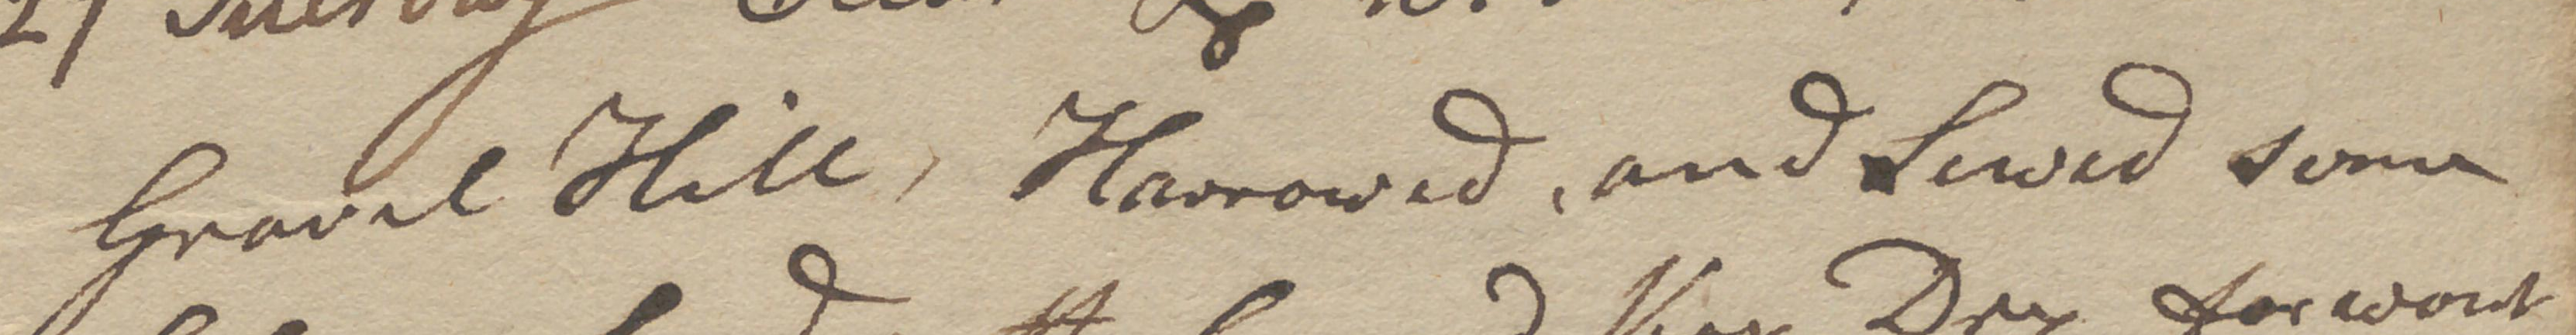Gravel Hill, Harrowed, and sewed some
